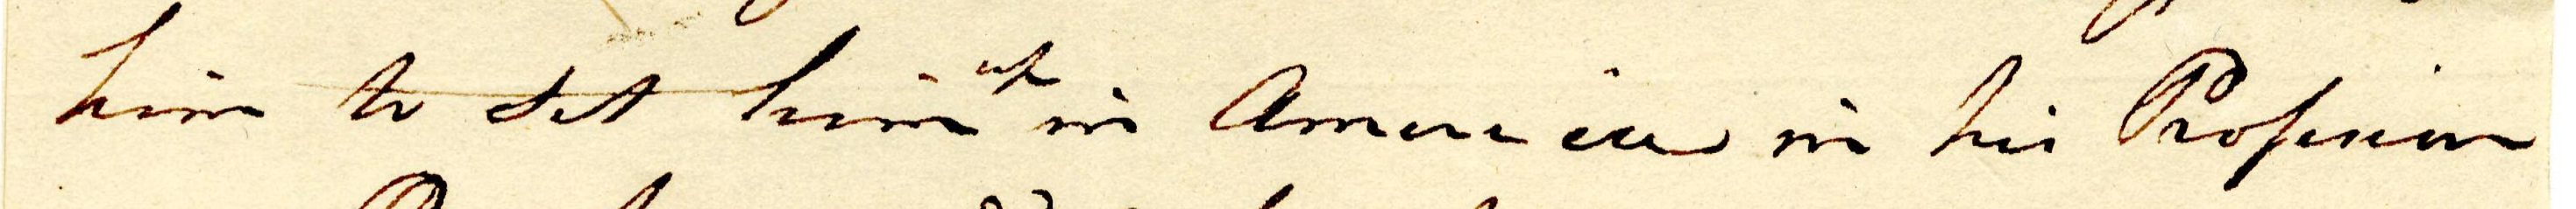him to set him him ^up in America in his Profession
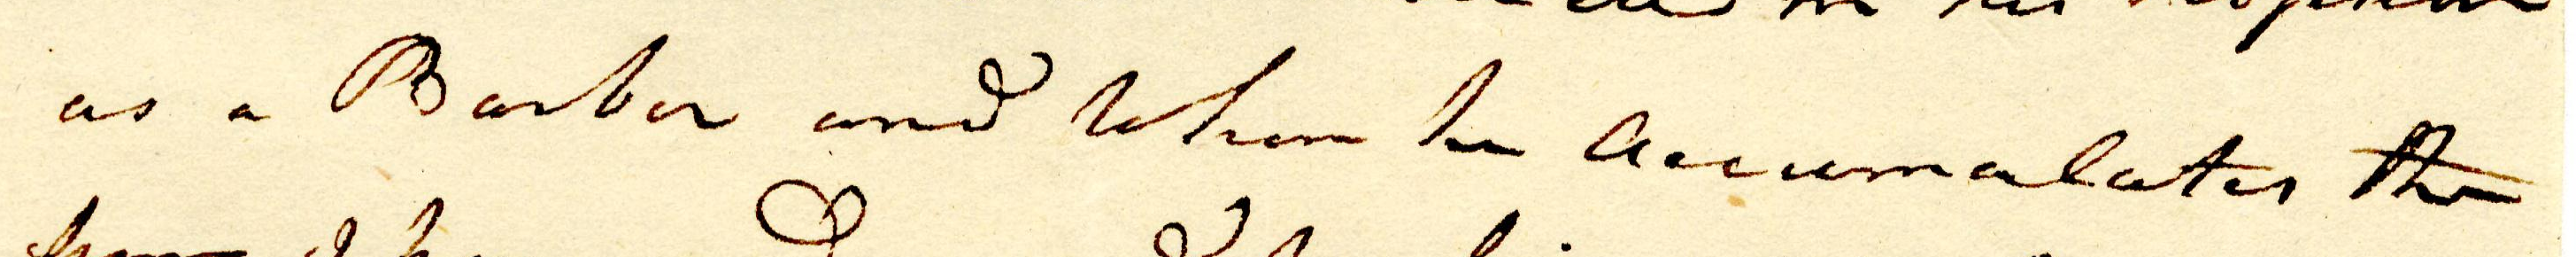as a Barber and when he accumalates the
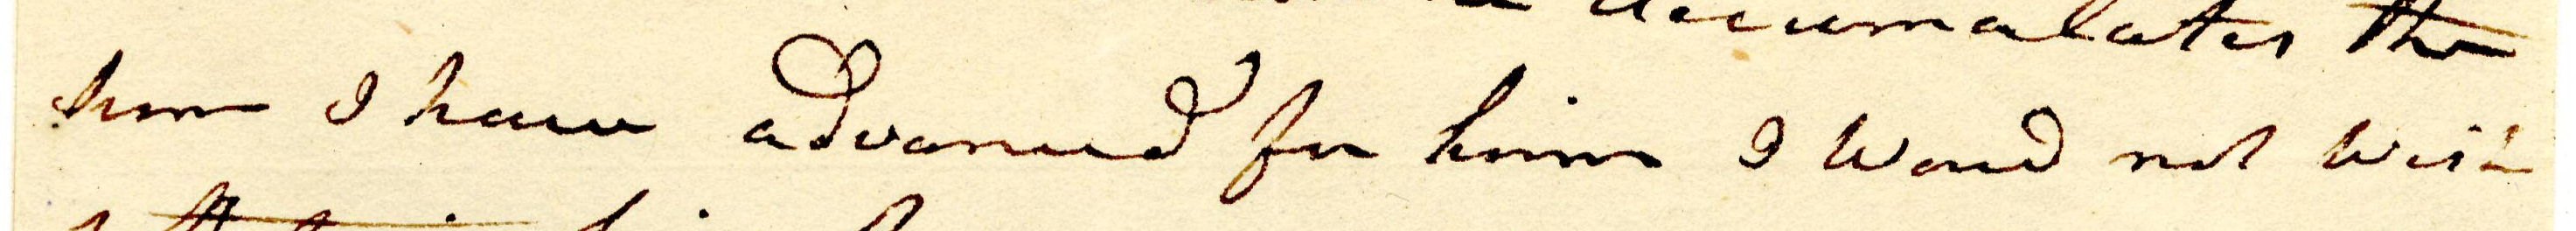sum I have advanced for him I Woud not Wish
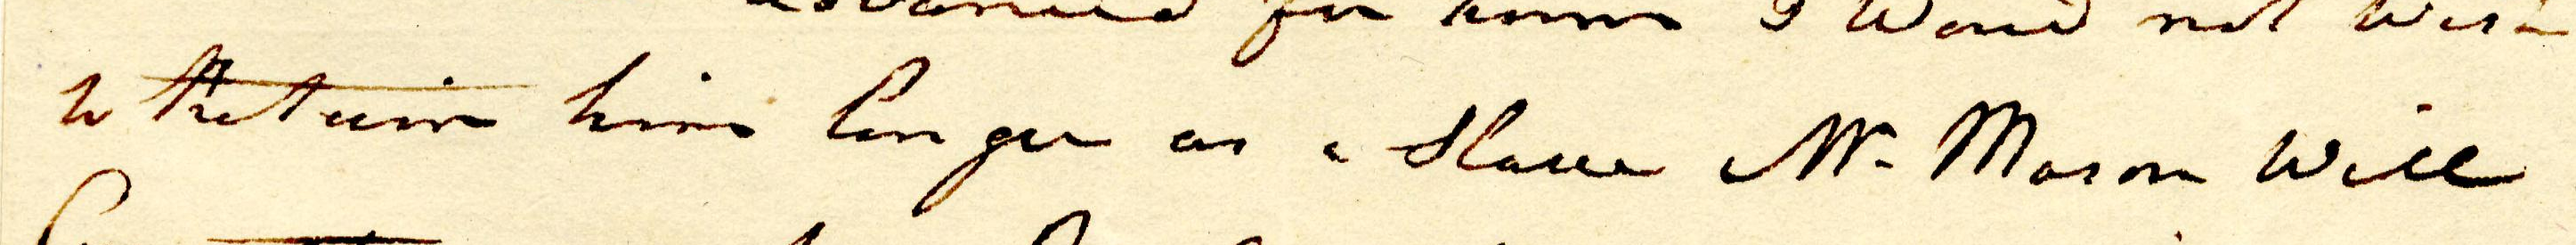to Retain him longer as a slave M^r. Mason will
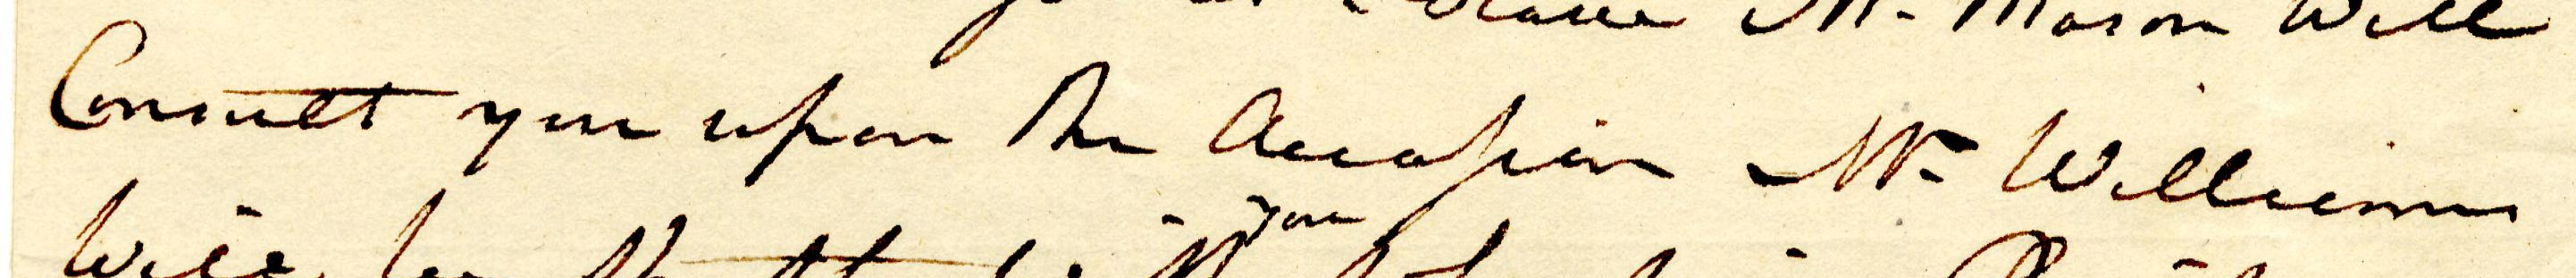Consult you upon the Accasion M^r. Williams
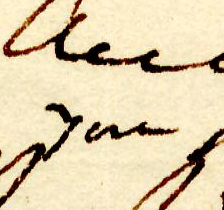you
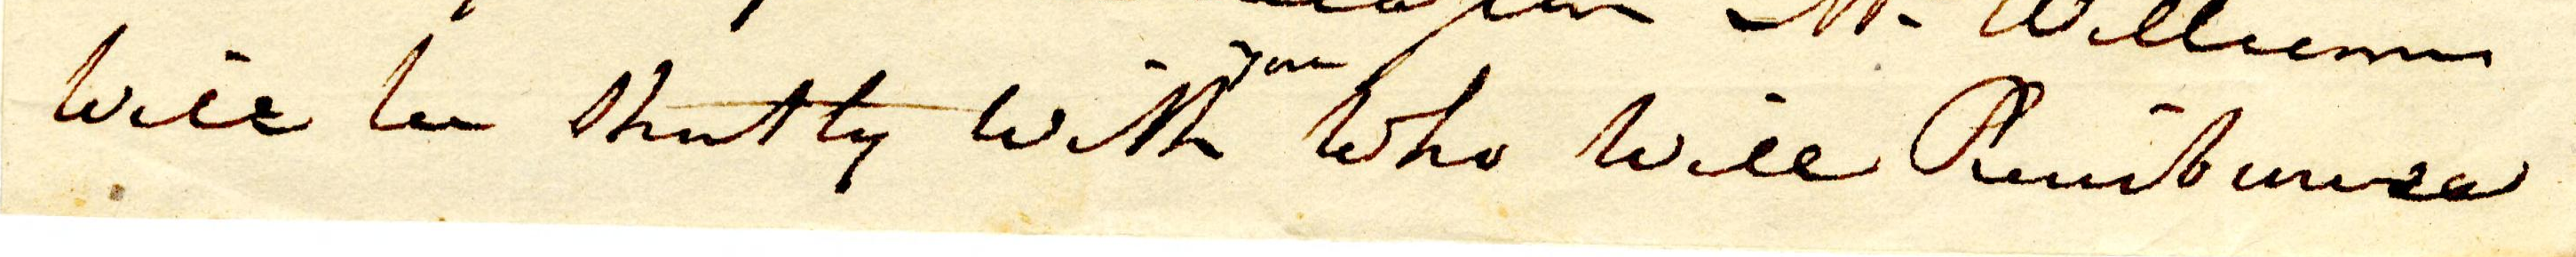will be shortly with who will Reimburse
